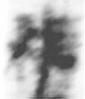柘
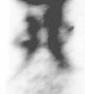四
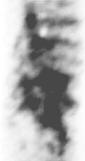馭（御）
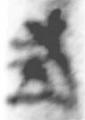○（右）
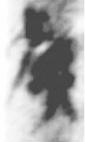○（殿）
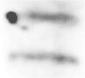二
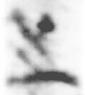之
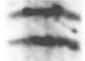二
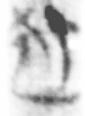狐
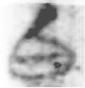白
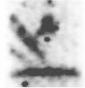之
